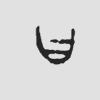曰
